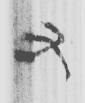又
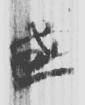國
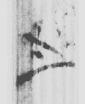之
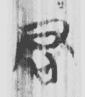君
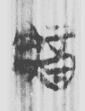𨟻
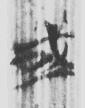或
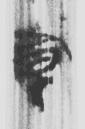倝
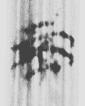不
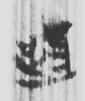{足欠}
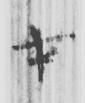才
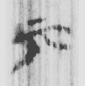亓
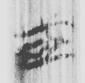或
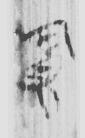貪
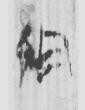於
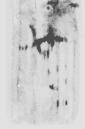{廿三}
